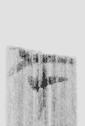不
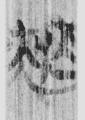勞
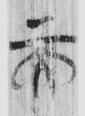而
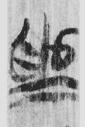爲
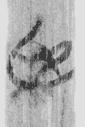臣
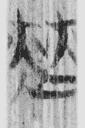勞
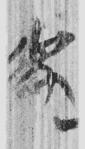虎
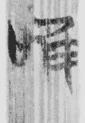唯
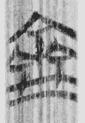齊
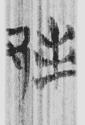邦
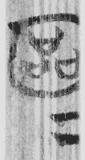區=
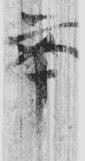不
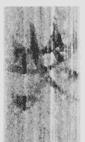若
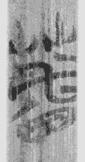蕃
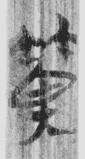箅
